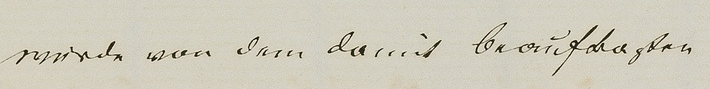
wurde von dem damit beauftragten
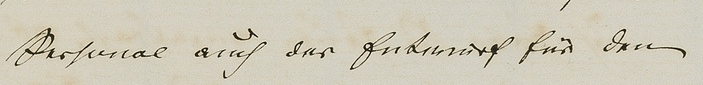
Personal auch der Entwurf für den
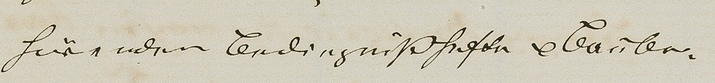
hörenden Bedingnißhefte & Baube-
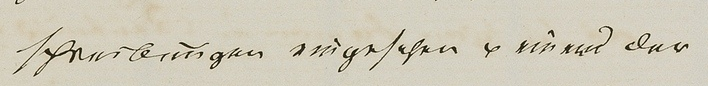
schreibungen eingesehen & einer der
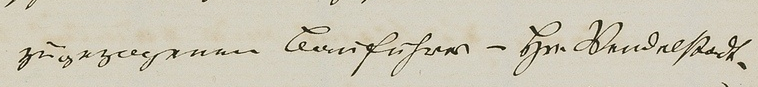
zugezogenen Bauführer – Hr. Wendelstadt –
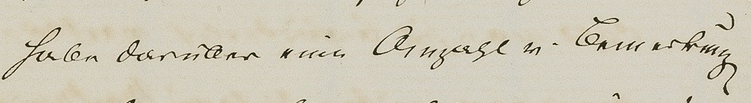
habe darüber eine Anzahl v. Bemerkungen
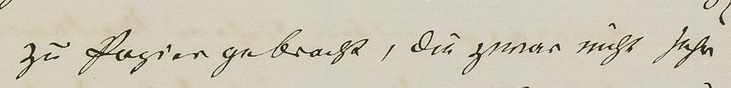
zu Papier gebracht, die zwar nicht sehr
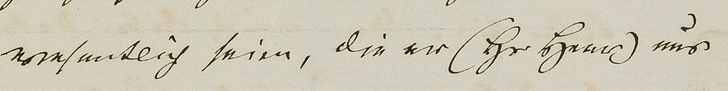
wesentlich seien, die er (Hr. Heer) uns
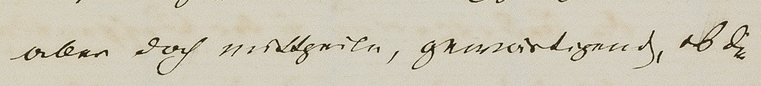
aber doch mittheile, gewärtigend, ob die
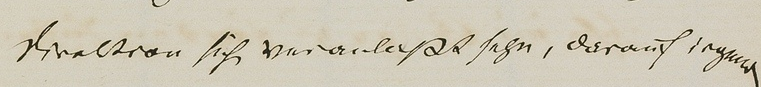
Direktion sich veranlaßt sehe, darauf irgend-
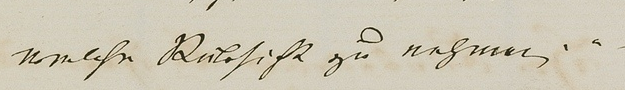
welche Rücksicht zu nehmen.» –
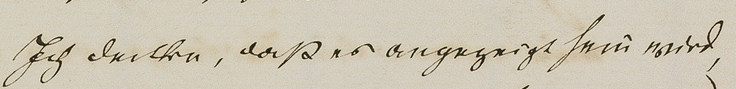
Ich denke, daß es angezeigt sein wird,
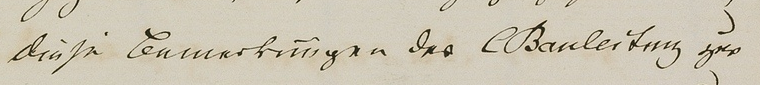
diese Bemerkungen der C Bauleitung zur
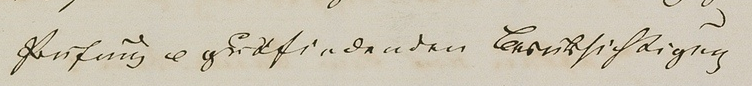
Prüfung & gutfindenden Berücksichtigung
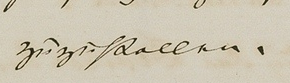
zuzustellen.
